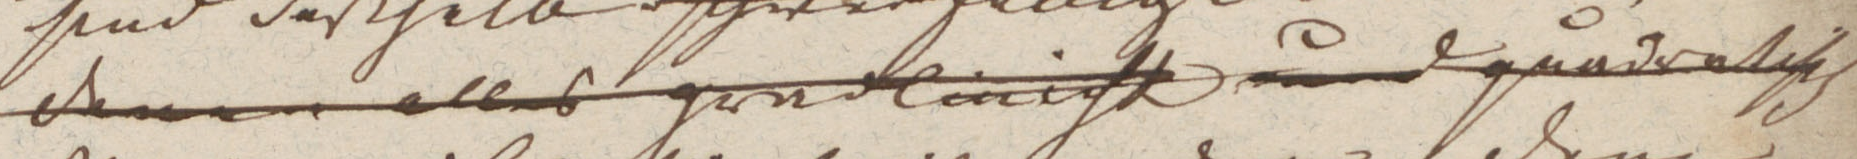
denen alles gradlinicht und quadratisch
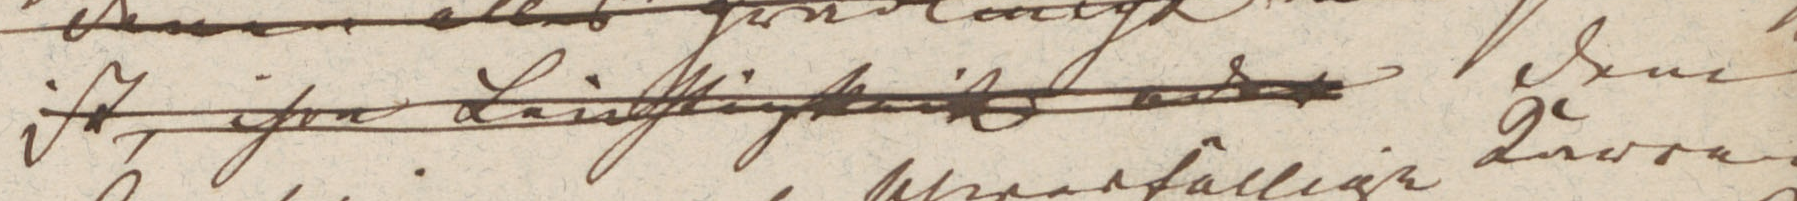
ist, ihre Leichtigkeit oder dem
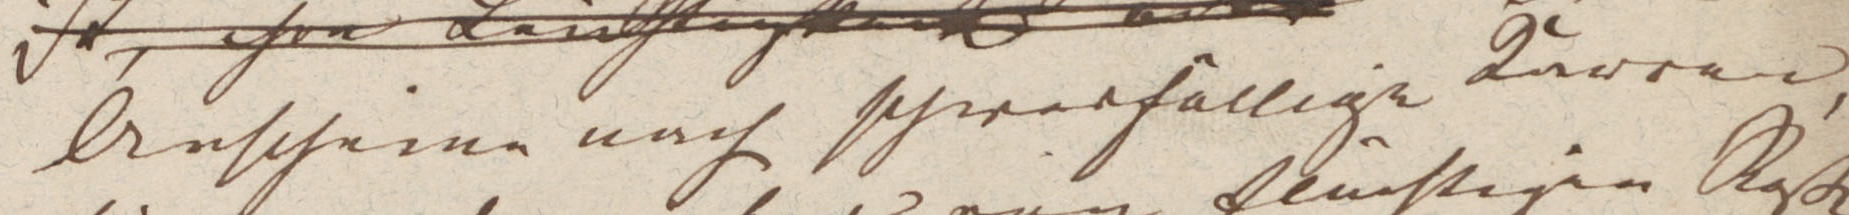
Anscheine nach schwerfällige Karren,
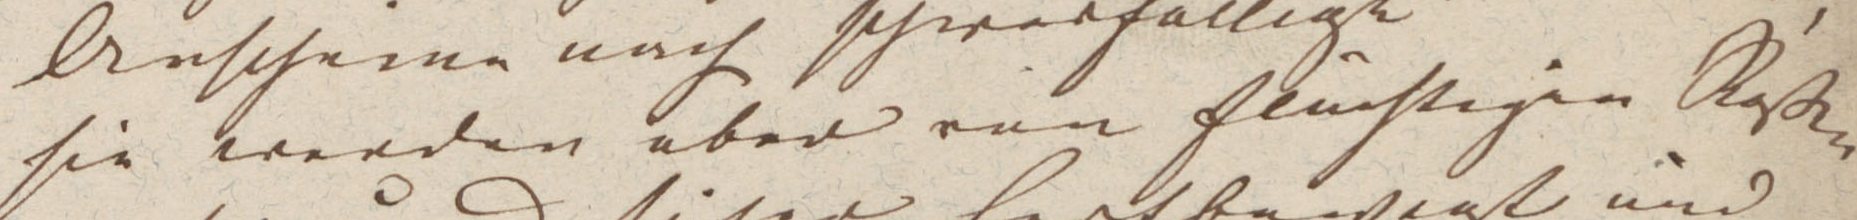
sie werden aber von flüchtigen Rossen
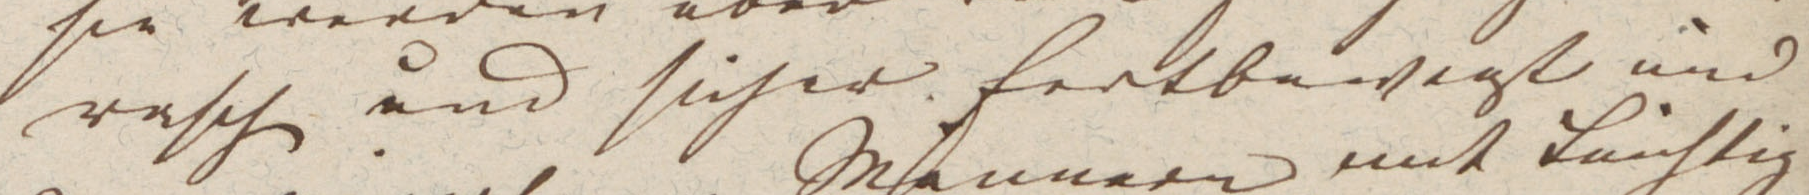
rasch und sicher fortbewegt und
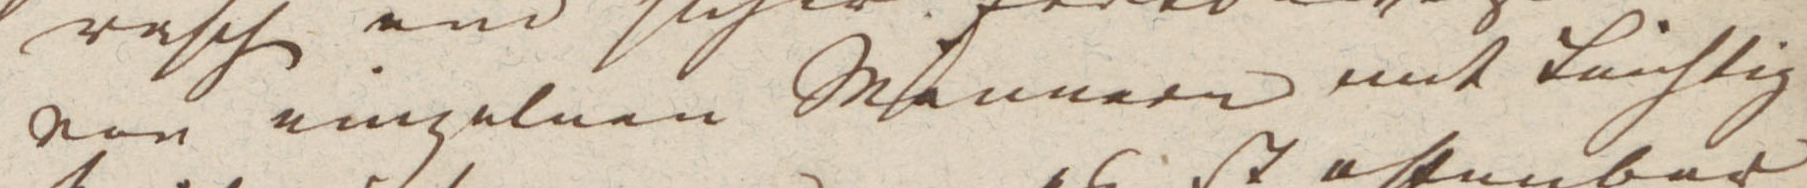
von einzelnen Männern mit Leichtig-
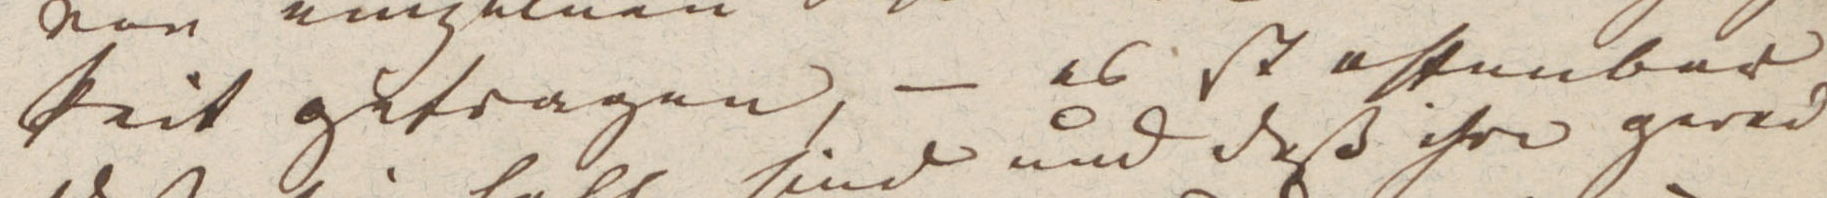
keit getragen, – es ist offenbar
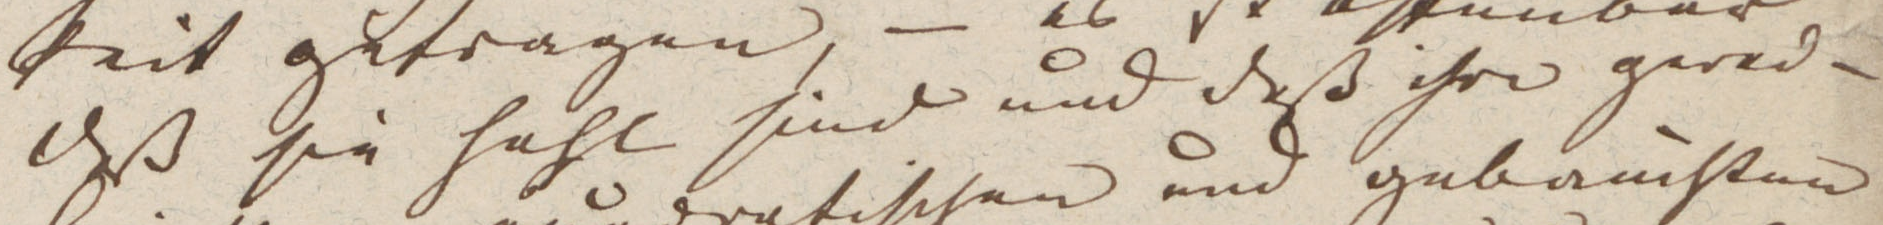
dass sie hohl sind und dass ihre gerad-
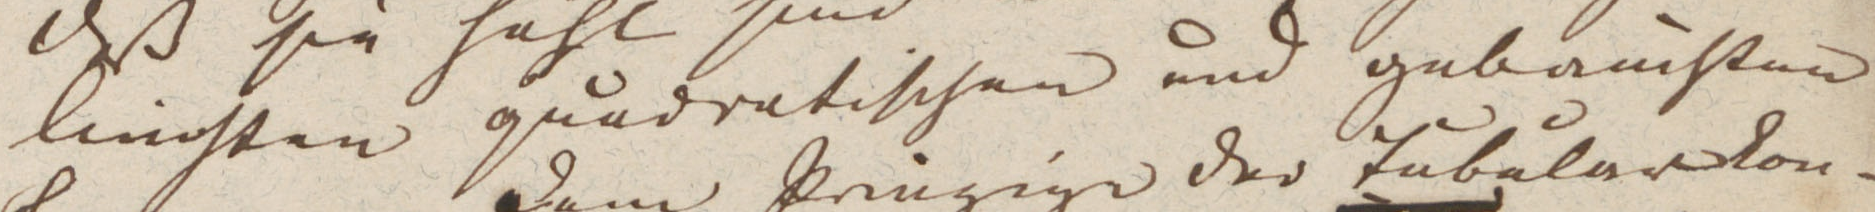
linichten quadratischen und gebauchten
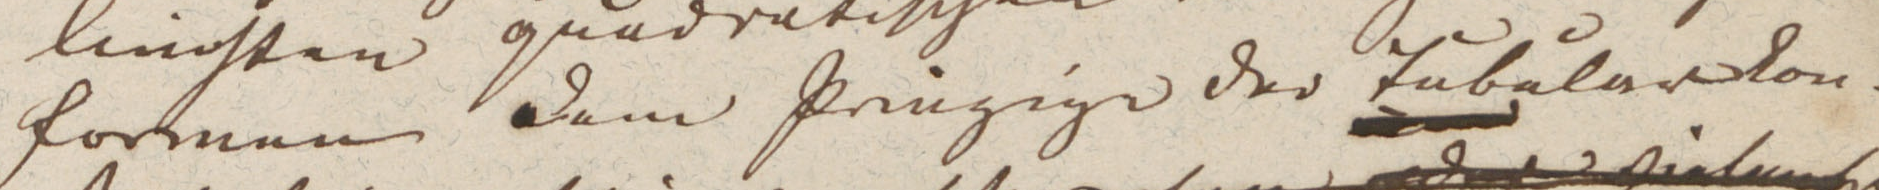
Formen dem Prinzipe der Tubularkon-
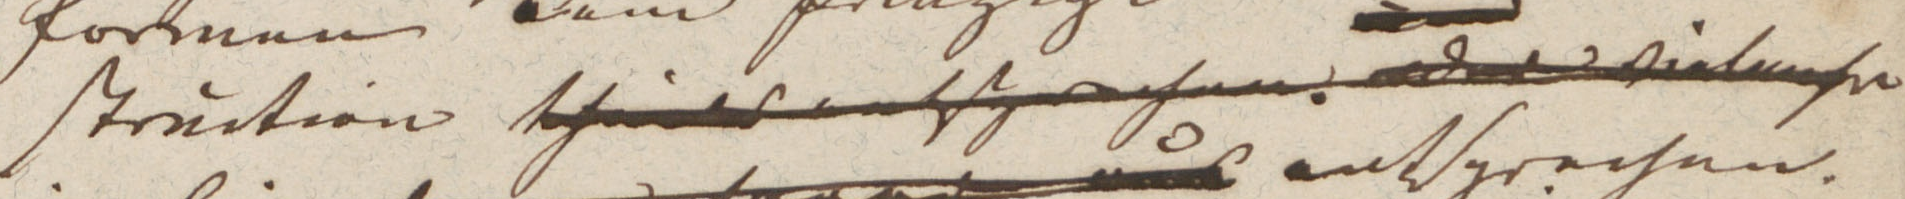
struction theils entsprechen. Der vielmehr
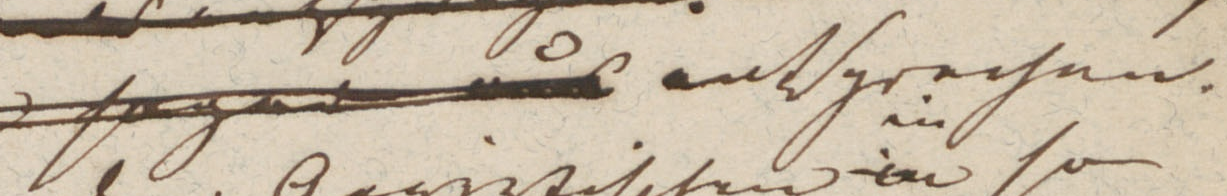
in Einzelnem sogar aus entsprechen.
